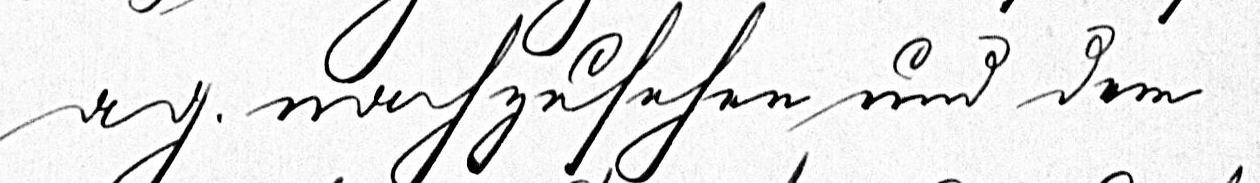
ag. nachzusehen und dem
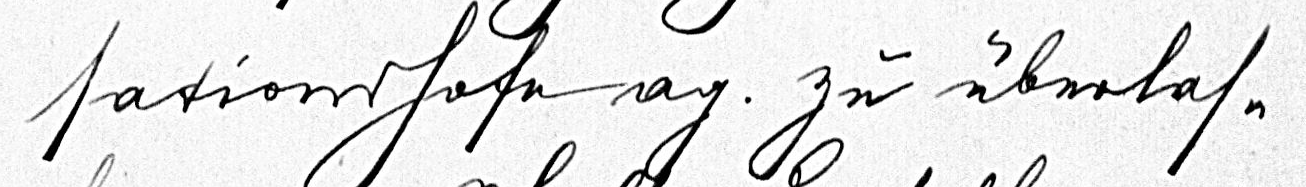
sationshofe ag. zu überlas¬
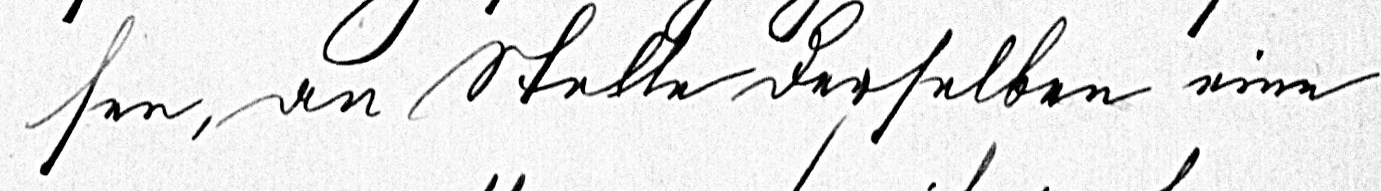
sen, an Stelle derselben eine
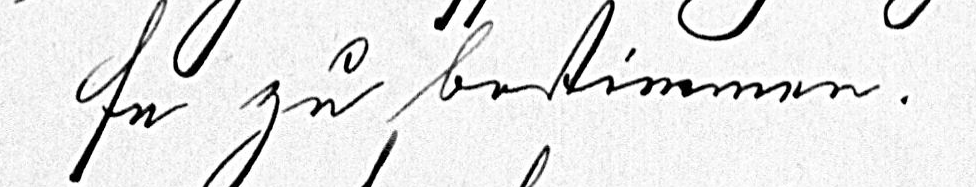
fe zu bestimmen.
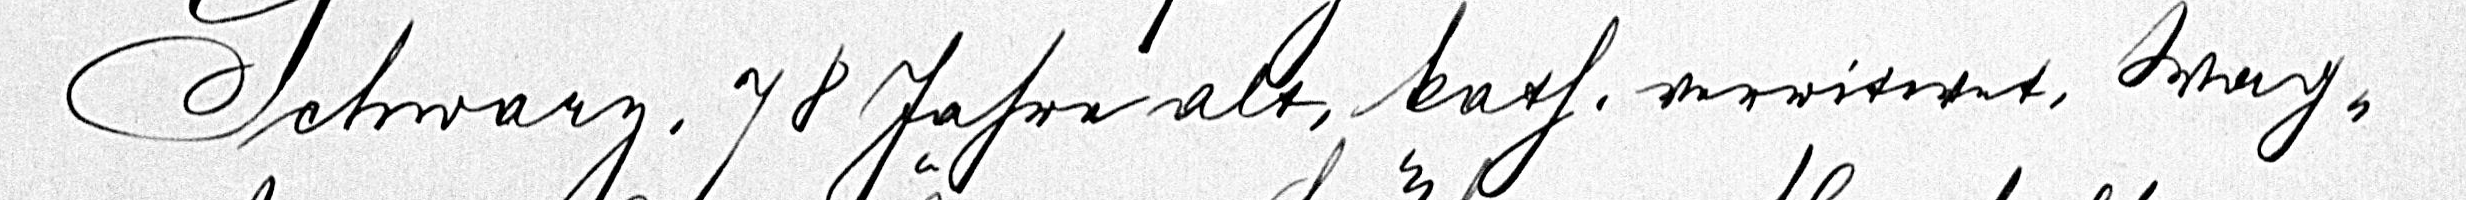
Schwarz. 78 Jahre alt, kath. verwitwet, Wag¬
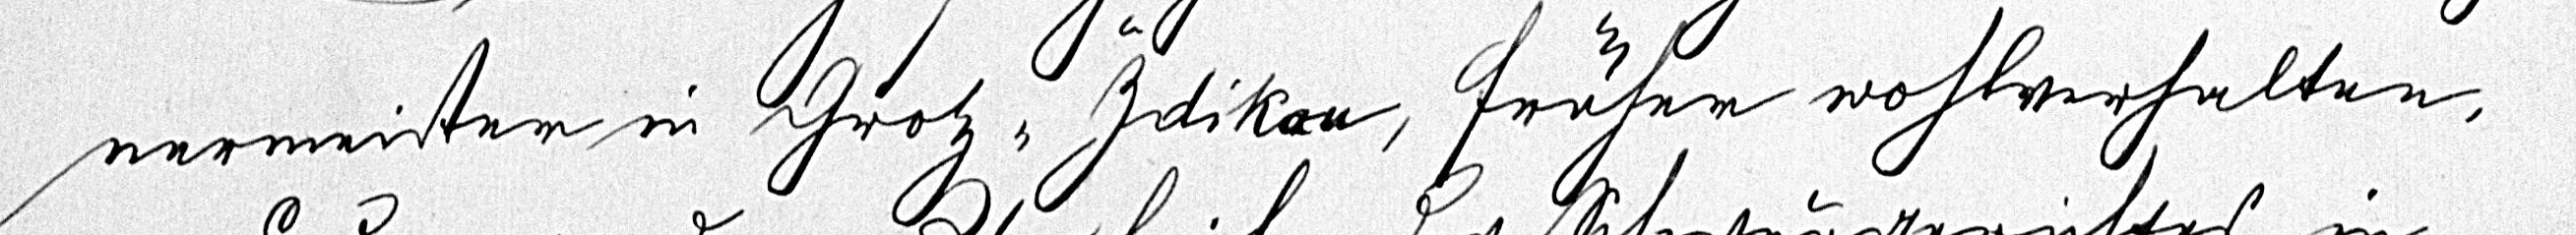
nermeister in Grotz-Zdikon, früher wohlverhalten,
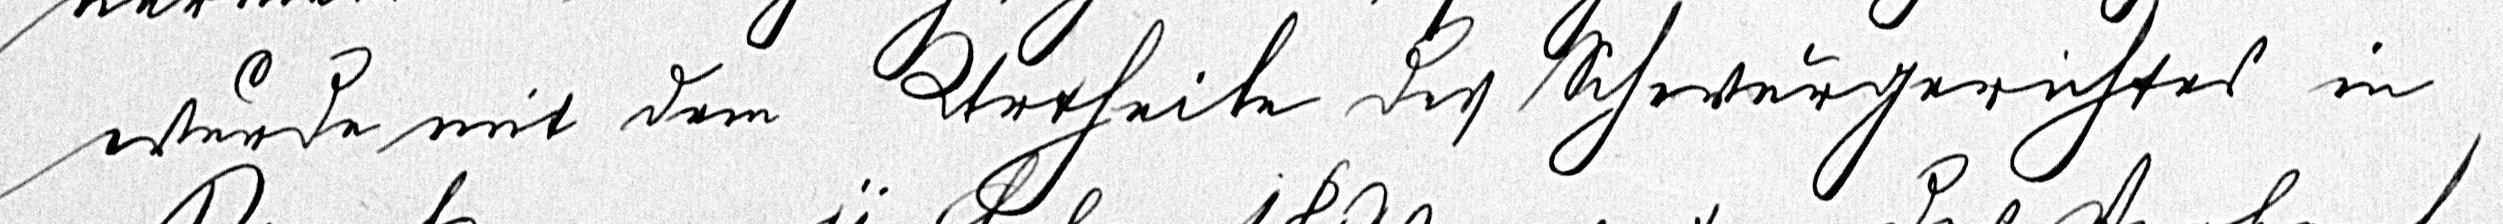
wurde mit dem Urtheile des Schwurgerichtes in
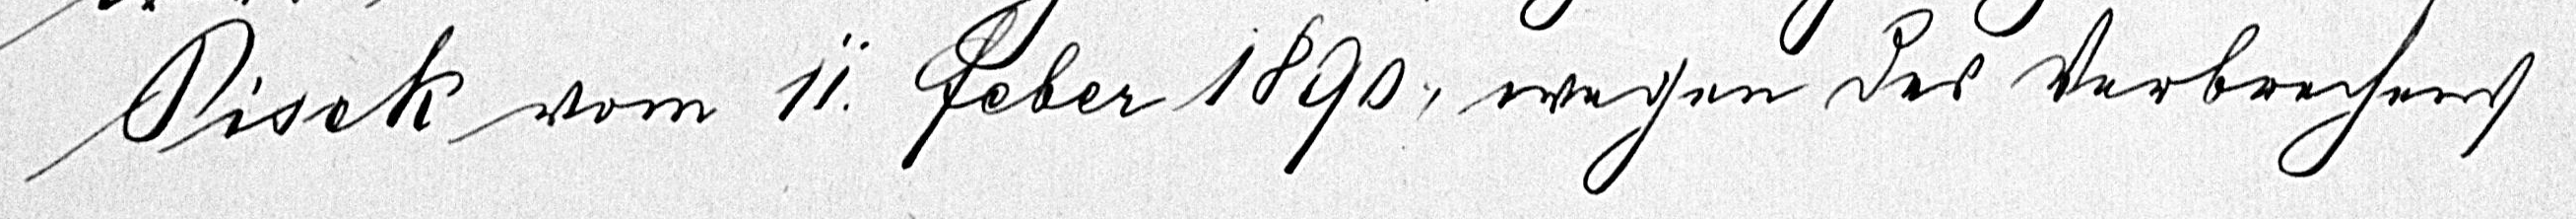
Pisek vom 11. Feber 1890, wegen des Verbrechens
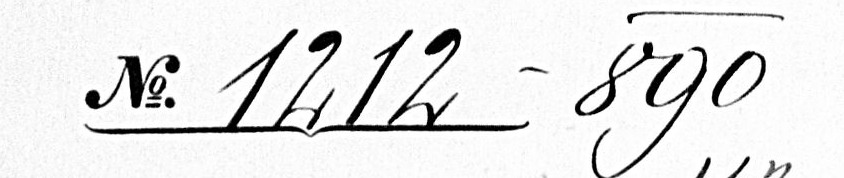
N° 1212 - 890
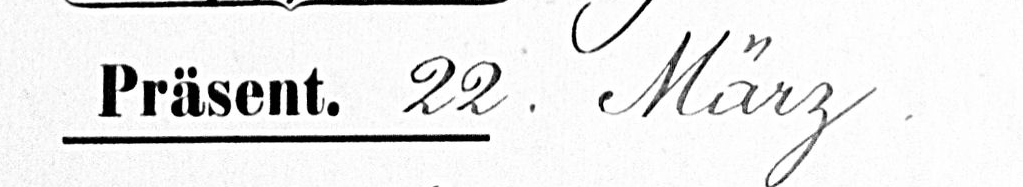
Präsent. 22. März.
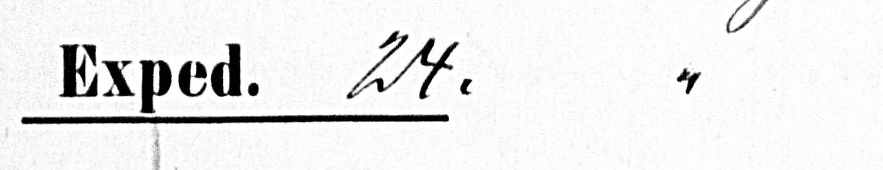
Exped. 24. März.
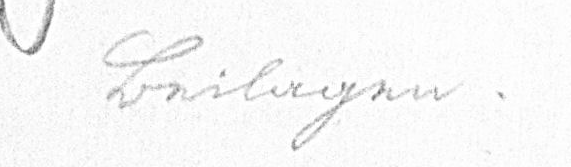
Beilagen.
